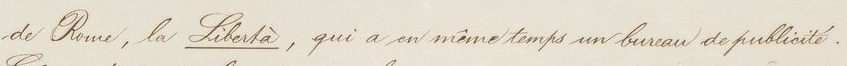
de Rome, la Libertà, qui a en même temps un bureau de publicité.
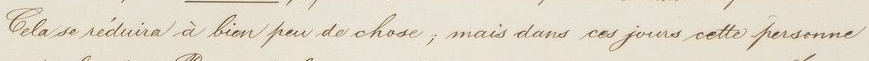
Cela se réduira à bien peu de chose; mais dans ces jours cette personne
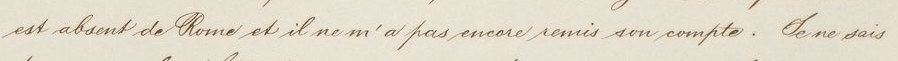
est absent de Rome et il ne m'a pas encore remis son compte. Je ne sais
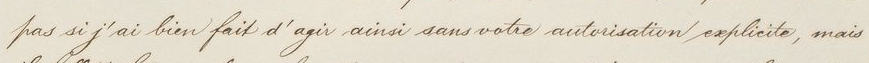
pas si j'ai bien fait d'agir ainsi sans votre autorisation explicite, mais
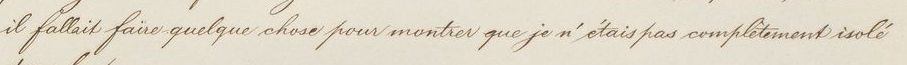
il fallait faire quelque chose pour montrer que je n'étais pas complètement isolé
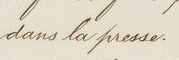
dans la presse.
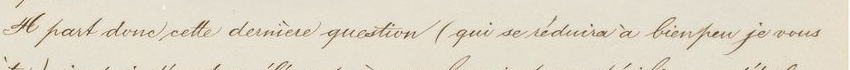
A part donc cette dernière question (qui se réduira à bien peu je vous
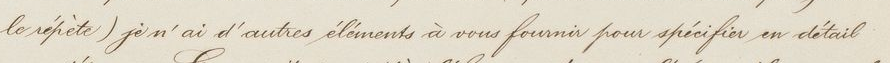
le répète) je n'ai d'autres éléments à vous fournir pour spécifier en détail
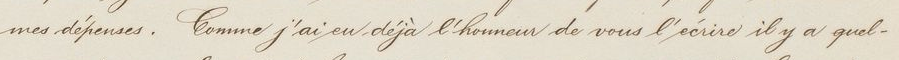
mes dépenses. Comme j'ai eu déjà l'honneur de vous l'écrire il y a quel-
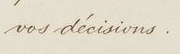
vos décisions.
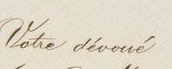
Votre dévoué
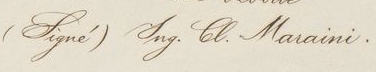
(Signé) Ing. Cl. Maraini.
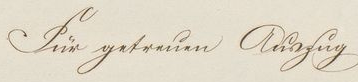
Für getreuen Auszug
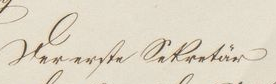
Der erste Sekretär
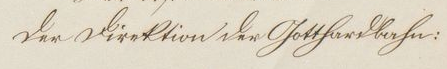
der Direktion der Gotthardbahn:
